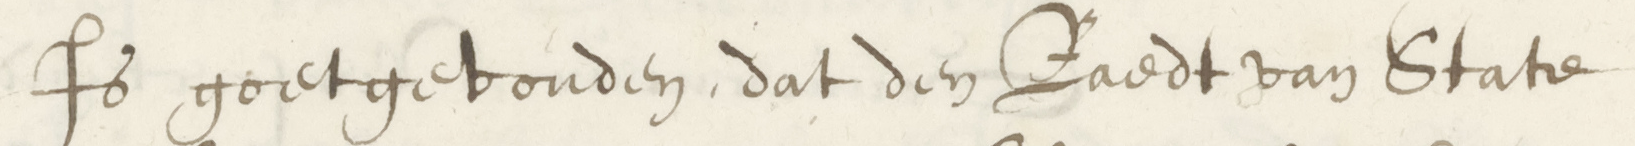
Is goetgevonden, dat den Raedt van State
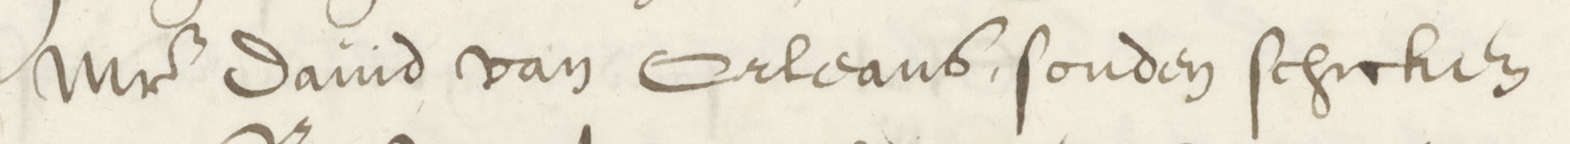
Mr David van Orleans, souden schicken
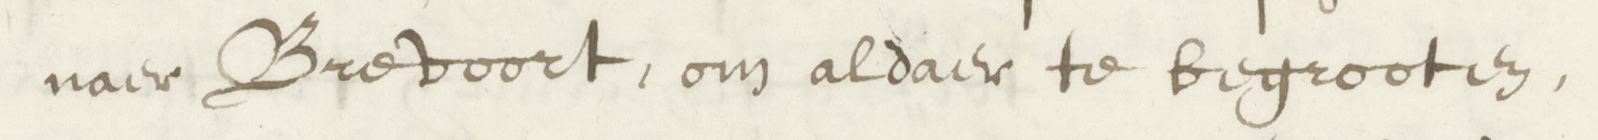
naer Brevoort, om aldaer te begrooten,
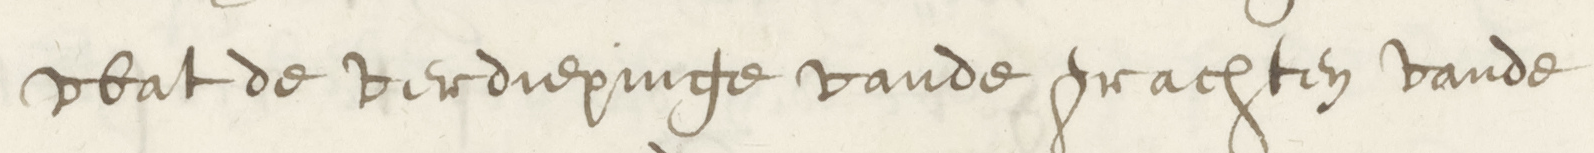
wat de verdiepinge vande grachten vande
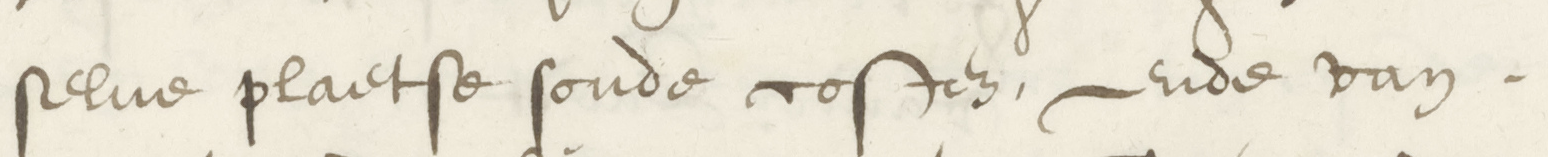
selue plaetse soude costen, ende van
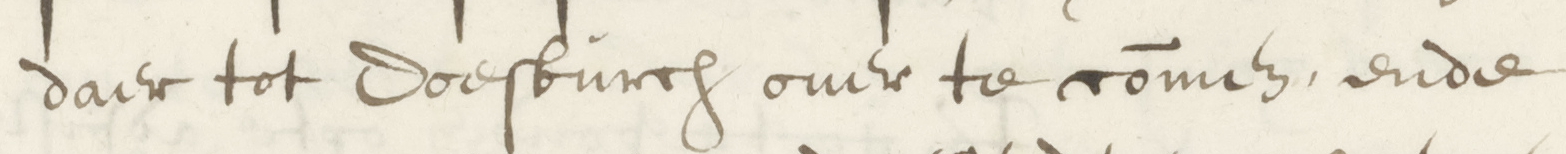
daer tot Doesburch over te comen, ende
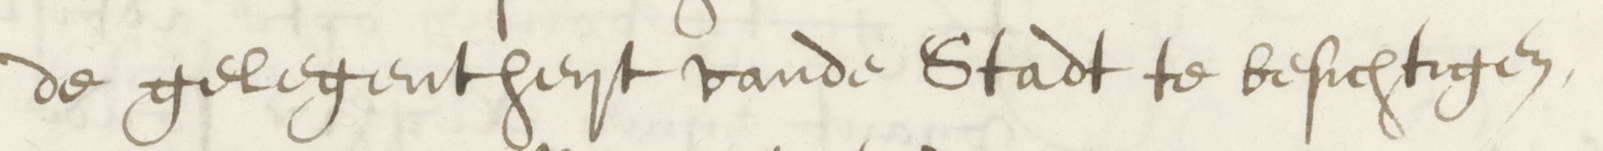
de gelegentheyt vande stadt te besichtigen
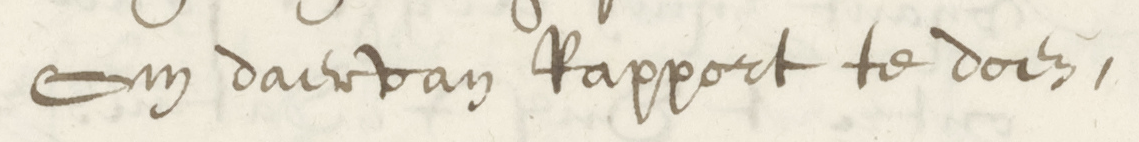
om daervan Rapport te doen.
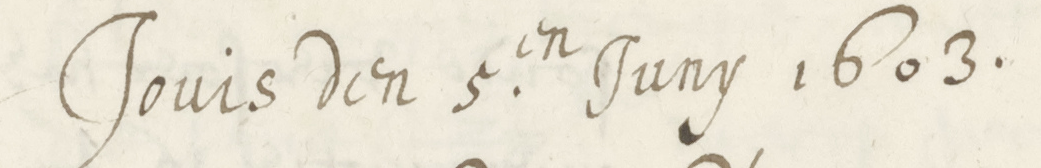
Jovis den 5.en Juny 1603.
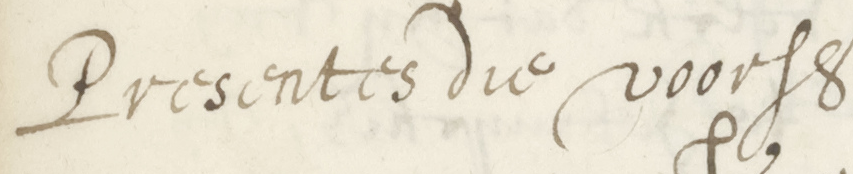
Presentes die voorss
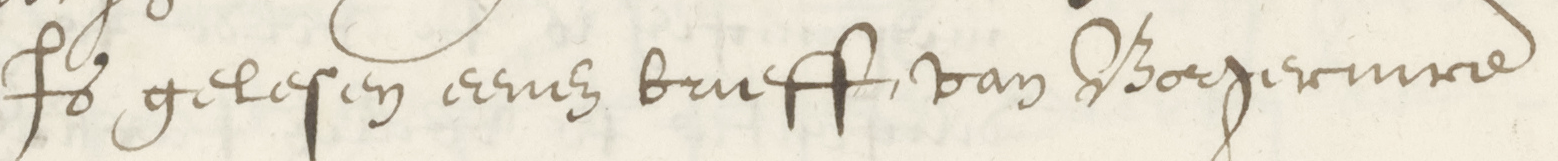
Is gelesen eenen brieff, van borgermres
